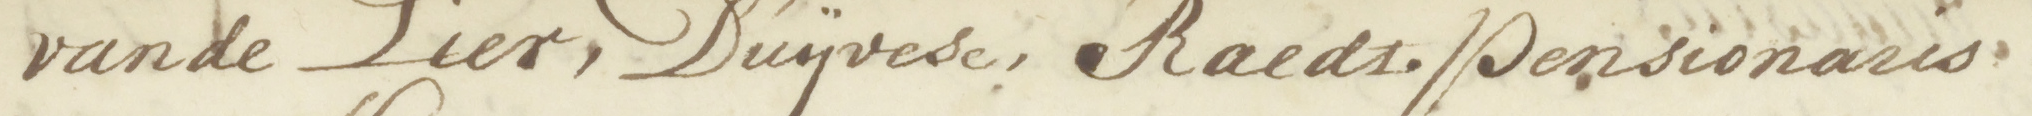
vande Lier, Duijvese, Raedt Pensionaris
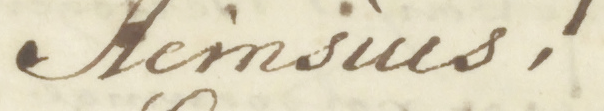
Heinsius,
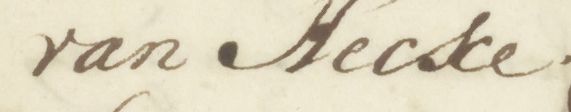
van Hecke
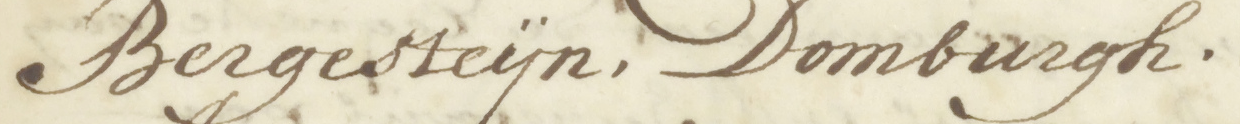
Bergesteijn, Domburgh,
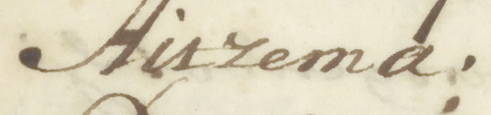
Aitzema,
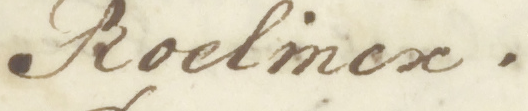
Roelmex,
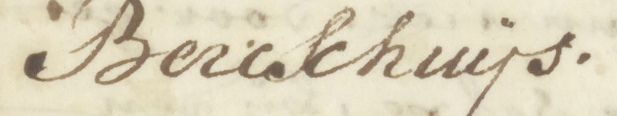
Berckhuijs.
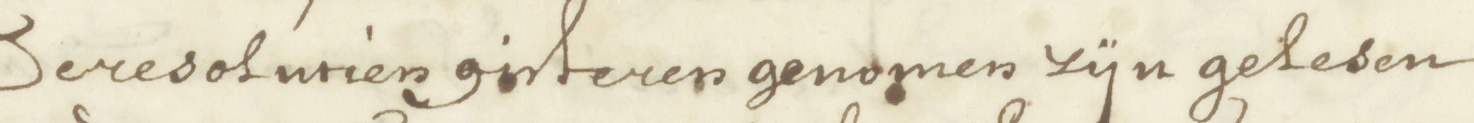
De resolutien gisteren genomen zijn gelesen
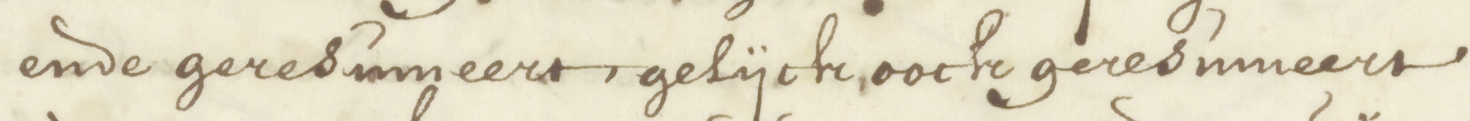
ende geresumeert, gelijck oock geresumeert
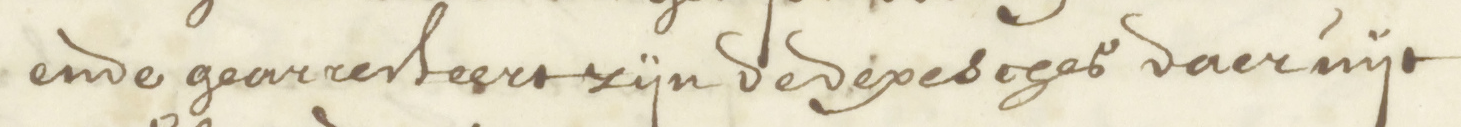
ende gearresteert zijn de depesches daeruijt
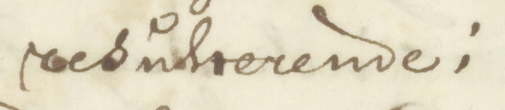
resulterende:
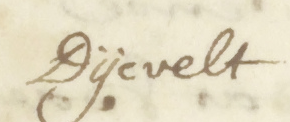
Dijcvelt
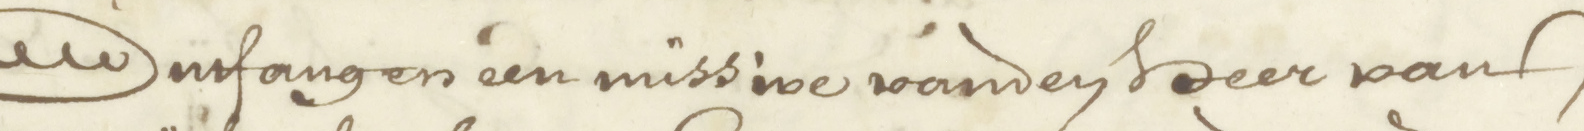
Ontfangen een missive vanden Heer van
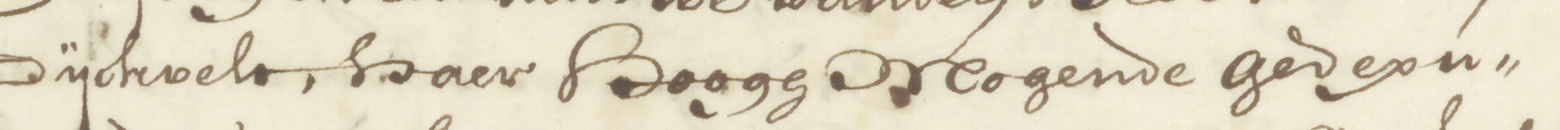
Dijckvelt, haer Hoogh Mogende gedepu„
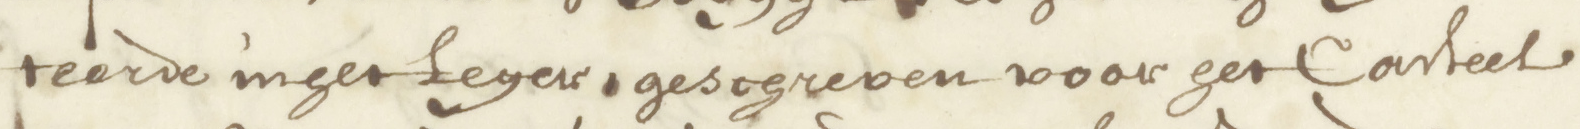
teerde in het leger, geschreven voor het Casteel
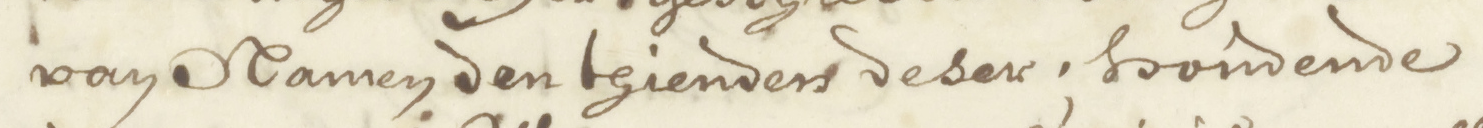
van Namen den thienden deser, houdende
